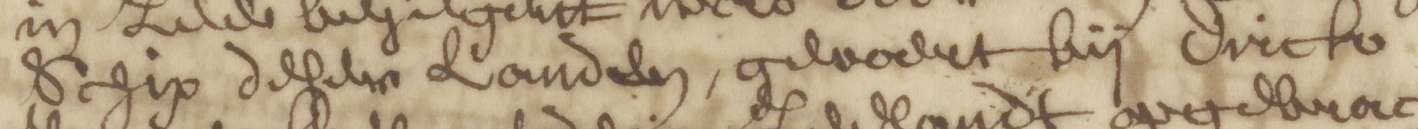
Schip deser Landen, gevoert bij Dirck
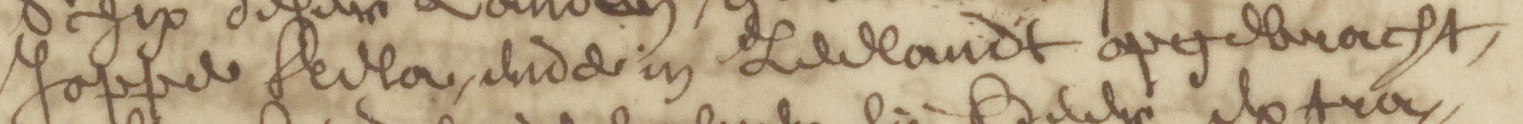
Joppe Kela, ende in Zeelandt opgebracht,
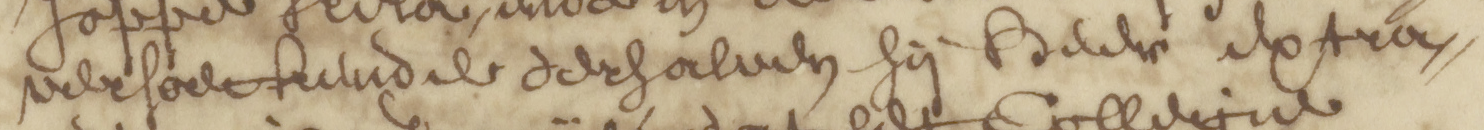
versoeckende derhalven hij Heer extra„
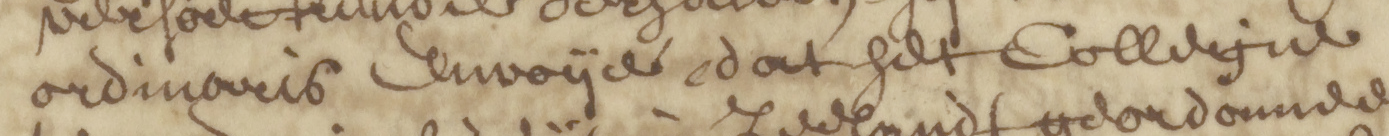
ordinaris Envoijé, dat het Collegie
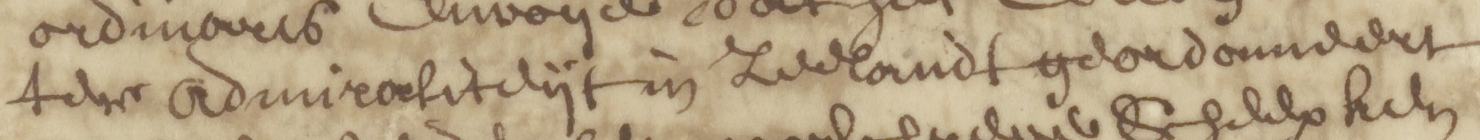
ter Admiraliteijt in Zeelandt geordonneert
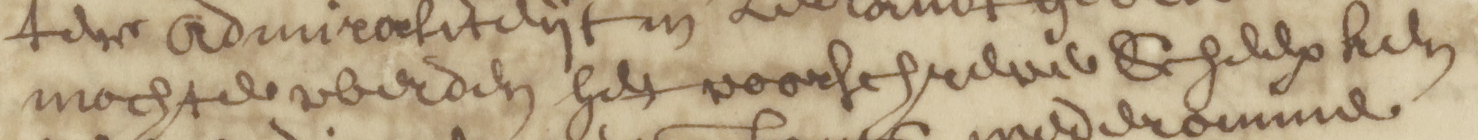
mochte werden het voorschreve Scheepken
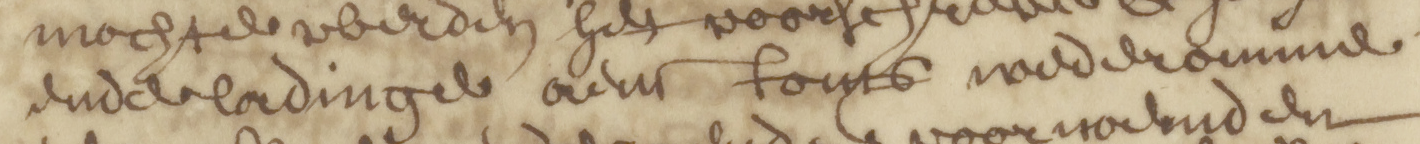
ende ladinge aenstonts wederomme
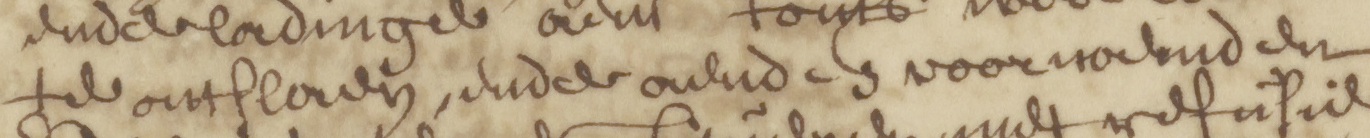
te ontslaen, ende aenden voornoemden
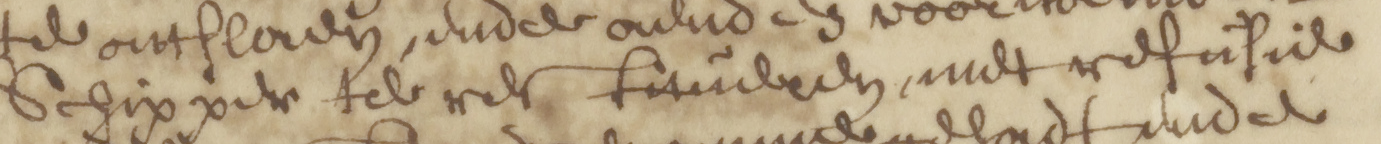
Schipper te restitueren, met refusie
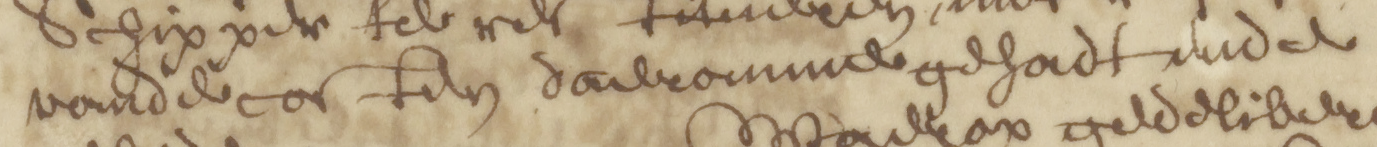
vande costen daeromme gehadt ende
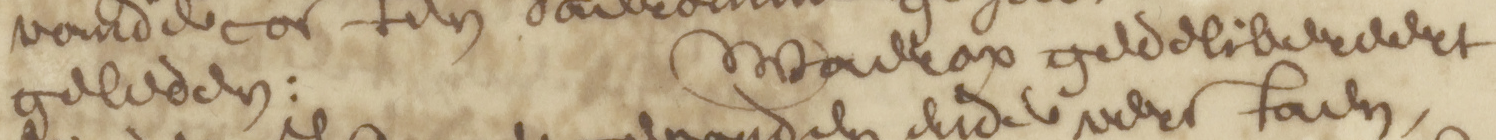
geleden: Waerop gedelibereert
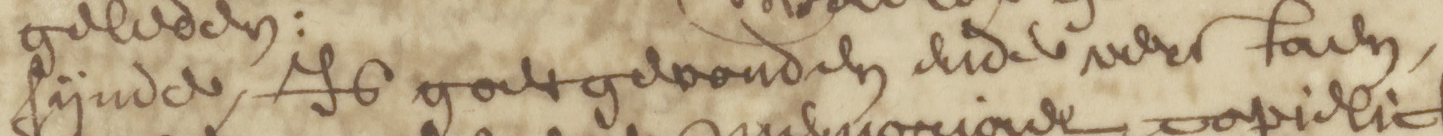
sijnde, Is goet gevonden ende verstaen,
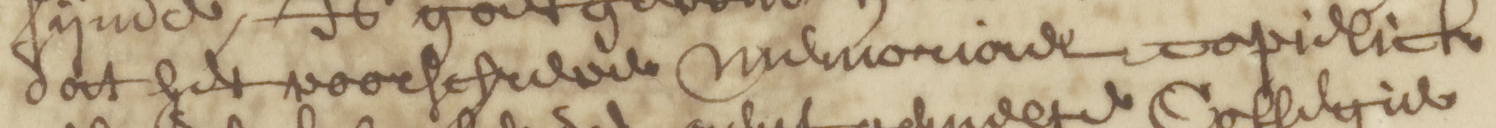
dat het voorschreve memoriael copielick
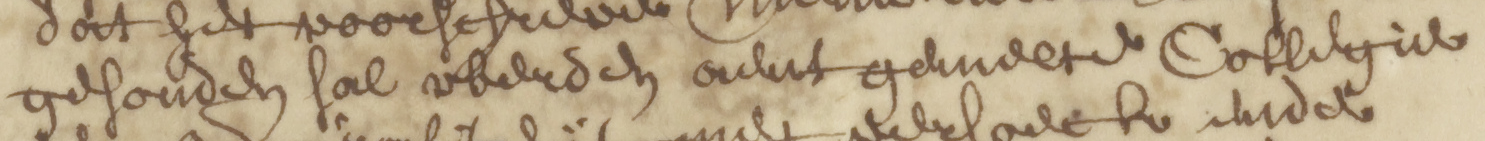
gesonden sal werden aent gemelte Collegie
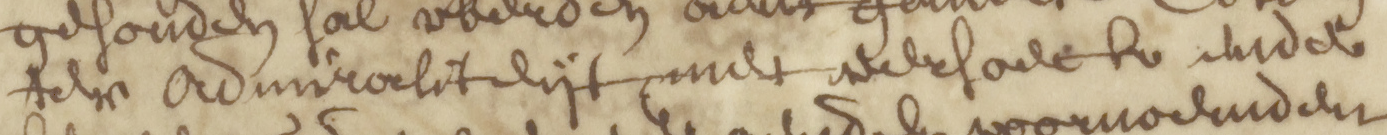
ter Admiraliteijt met versoeck ende
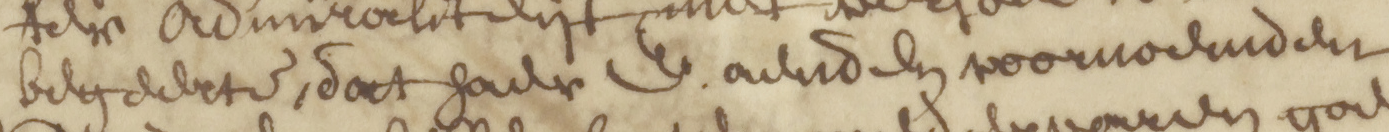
begeerte, dat haer E. aenden voornoemden
